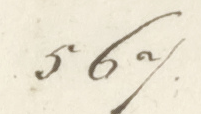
567
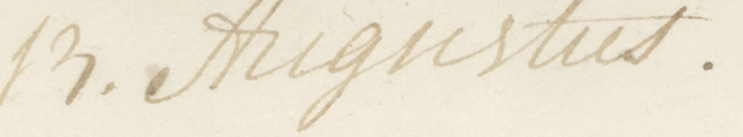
13. Augustus.
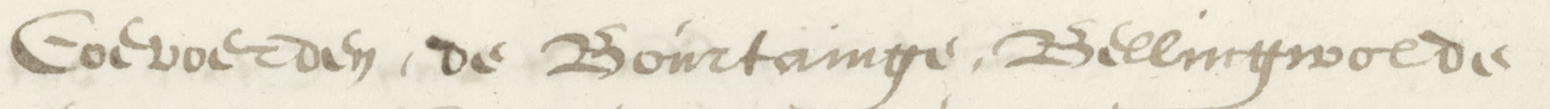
Coevoerden, de Bourtainge, Bellingwolde
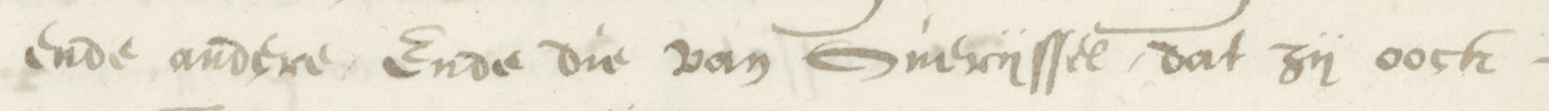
ende andere. Ende die van Ouerijssel, dat zij oock
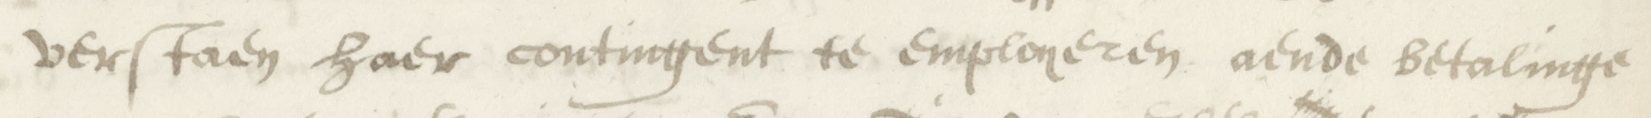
verstaen haer contingent te employeren aende betalinge
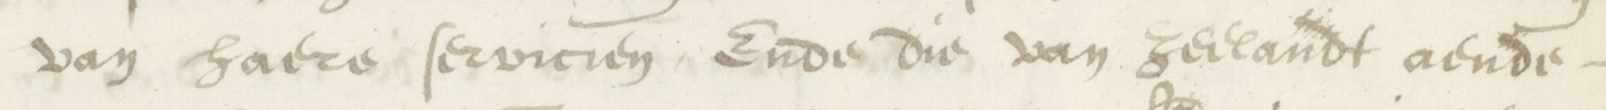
van haere servicien. Ende die van Zeelandt aende
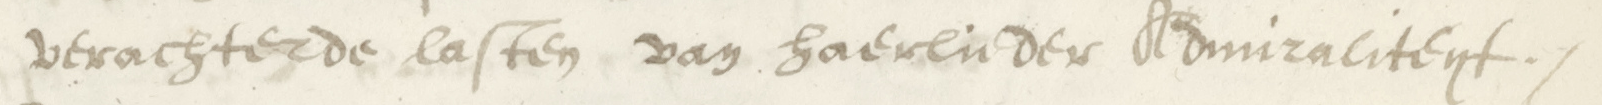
verachterde lasten van haeren der Admiraliteyt.
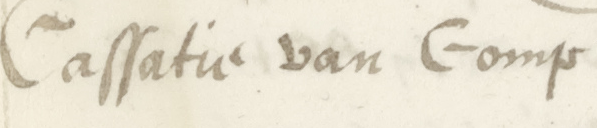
Cassatie van Compnien
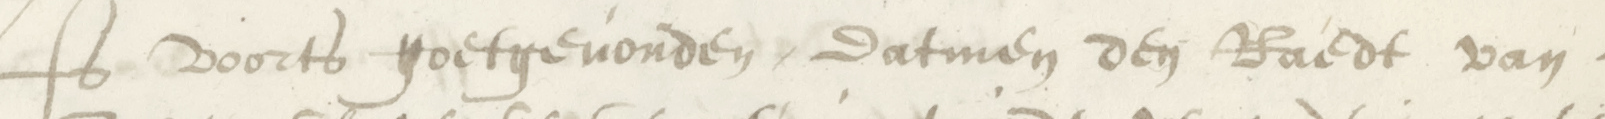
Is voorts goetgeuonden, dat men den Raedt van
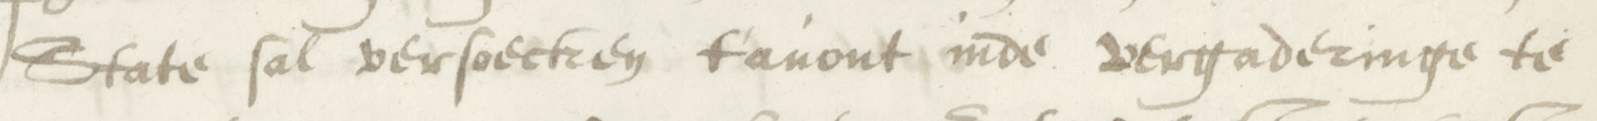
State sal versoecken t'auont inde vergaderinge te
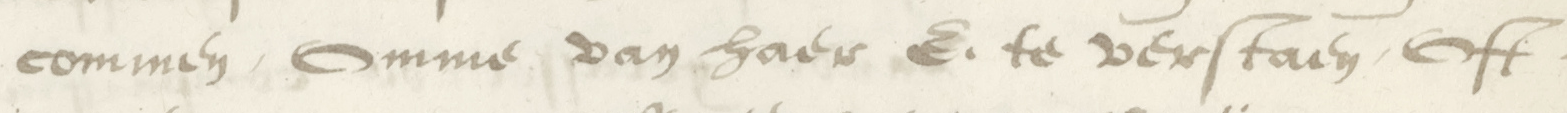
commen, omme van haer E. te verstaen, oft
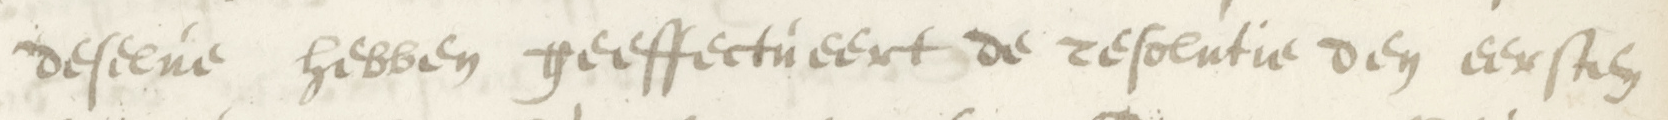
deselue hebben geeffectueert de resolutie den eersten
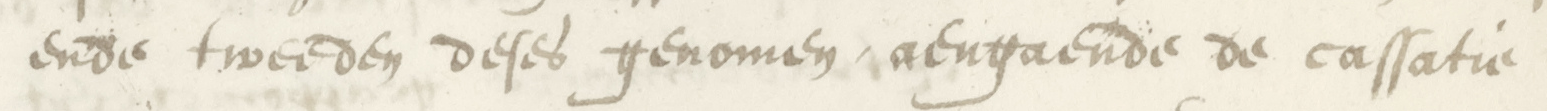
ende tweeden deses genomen, aengaende de cassatie
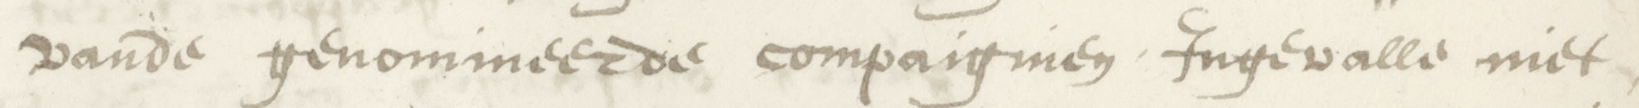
van de genomineerde compaignien Ingevalle niet
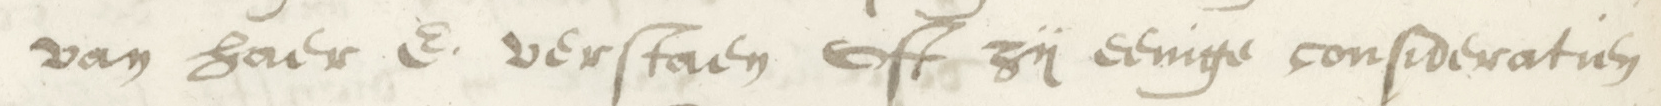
van haer E. verstaen off zij eenige consideratien
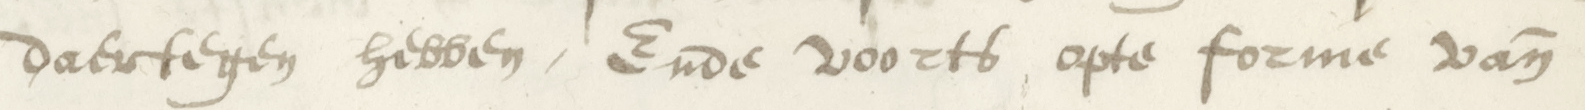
daertegen hebben. Ende voorts opte forme van
